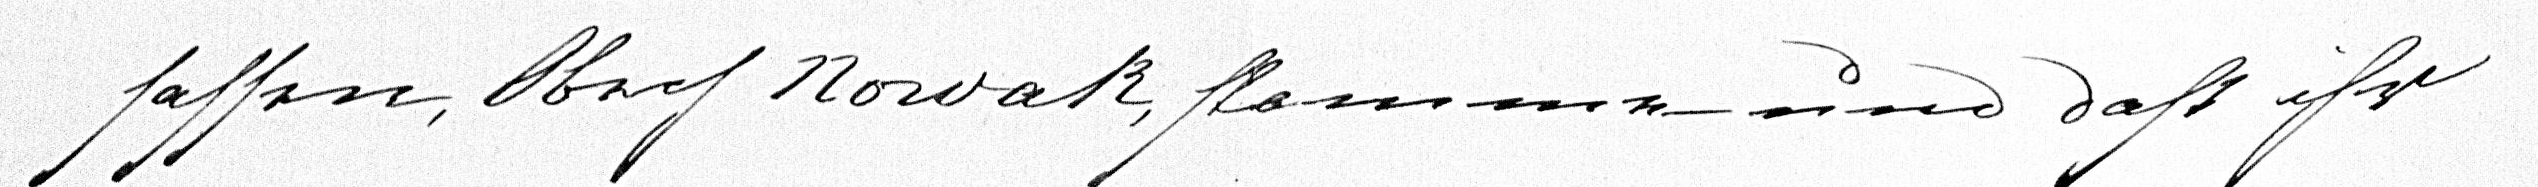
sassen, Obech Nowak, stamme und daß ihr
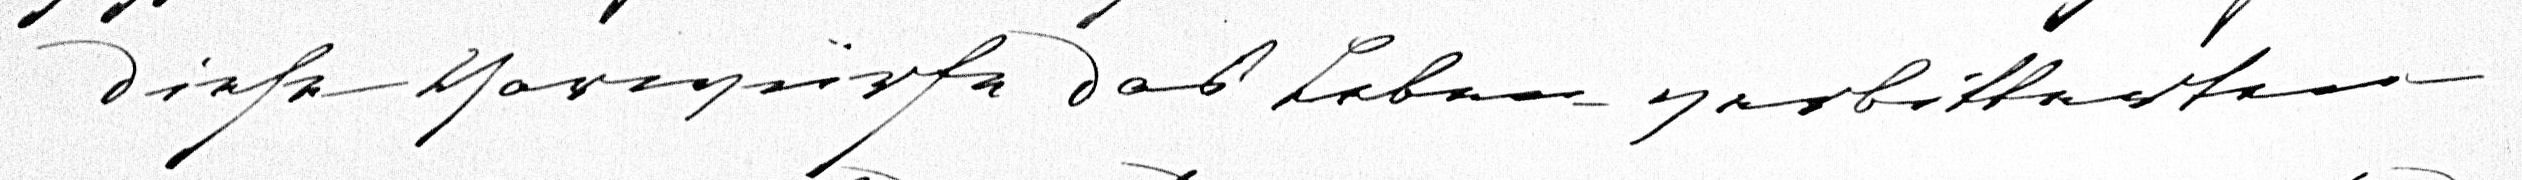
diese Vorwürfe das Leben verbitterten
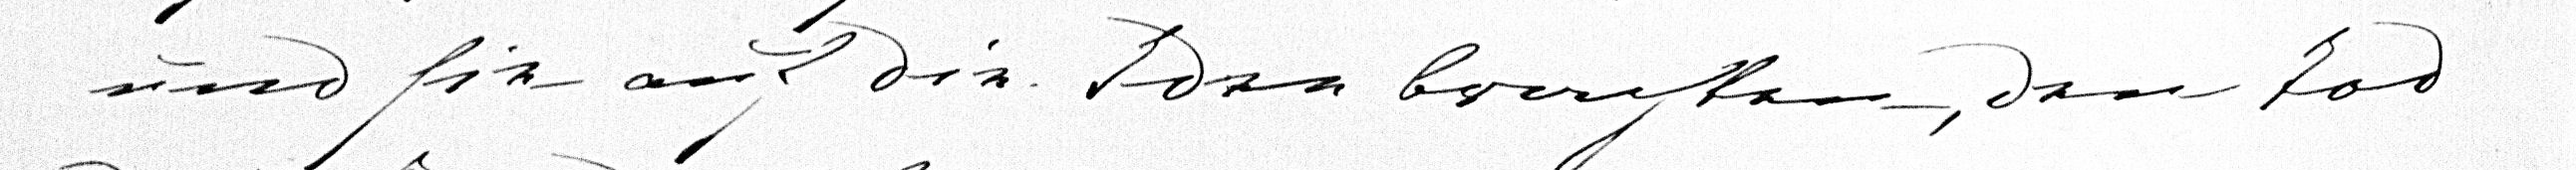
und sie auf die Iden brachten, den Tod
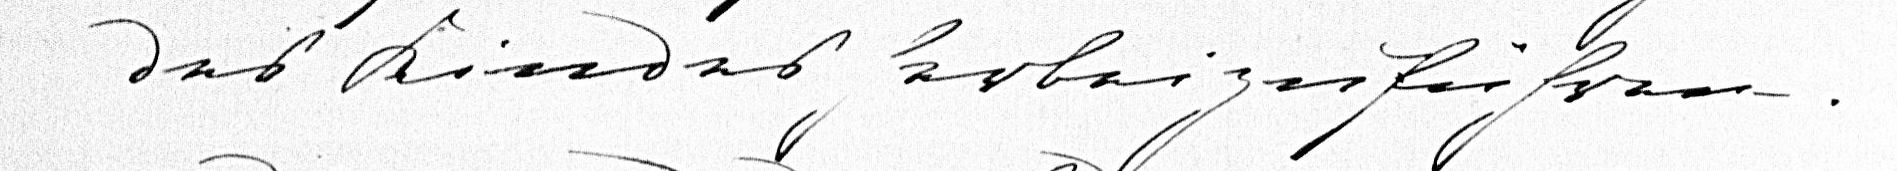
des Kindes herbeizuführen.
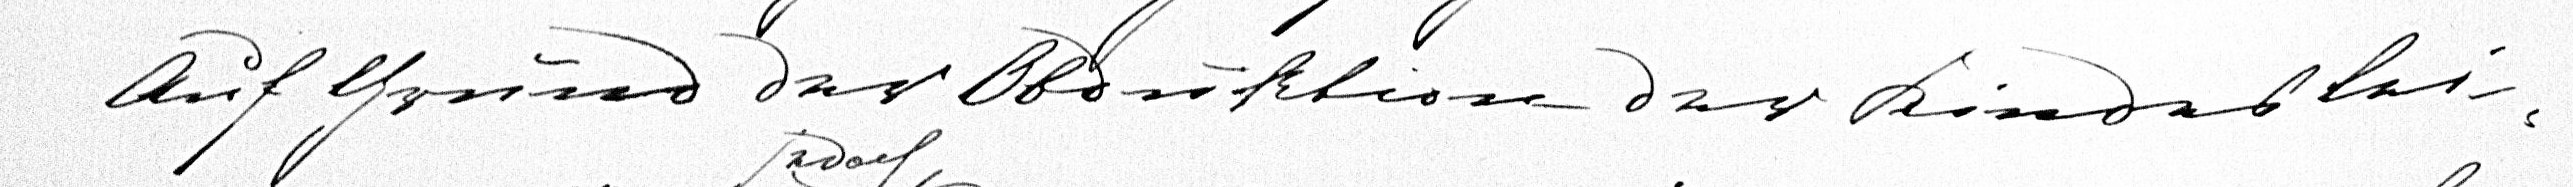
Auf Grund der Obduktion der Kindes lei¬
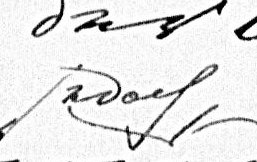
jedoch
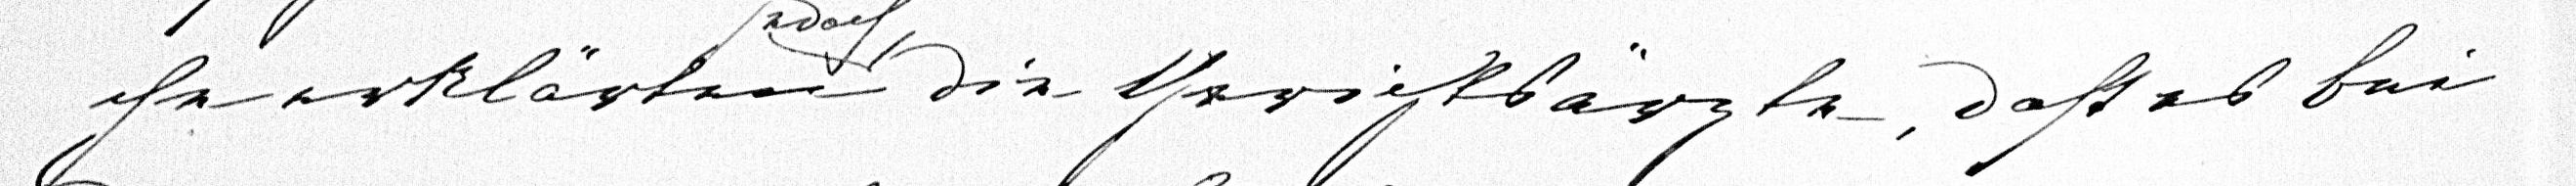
che erklärten die Gerichtsärzte, daß es bei
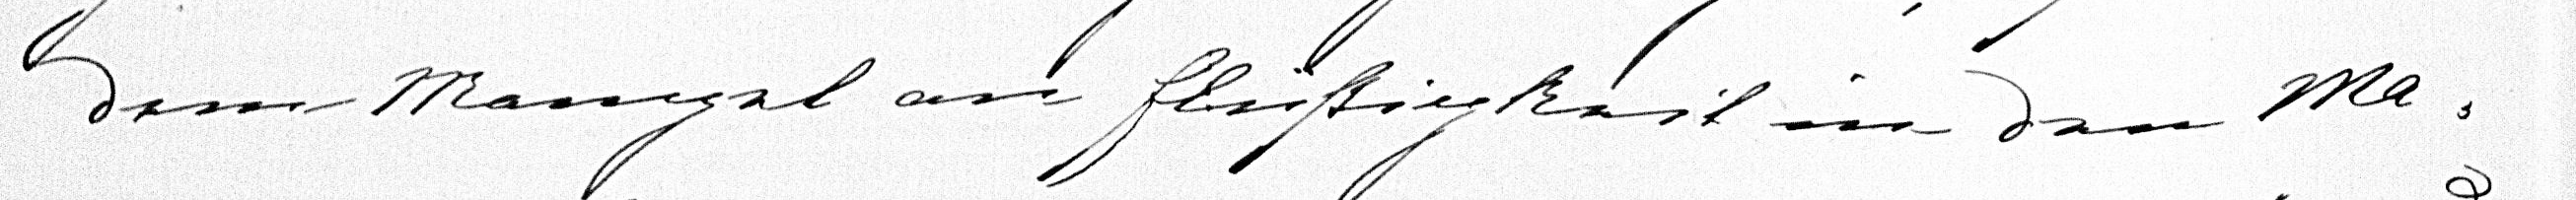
dem Mangel an Flüßigkeit in den Ma¬
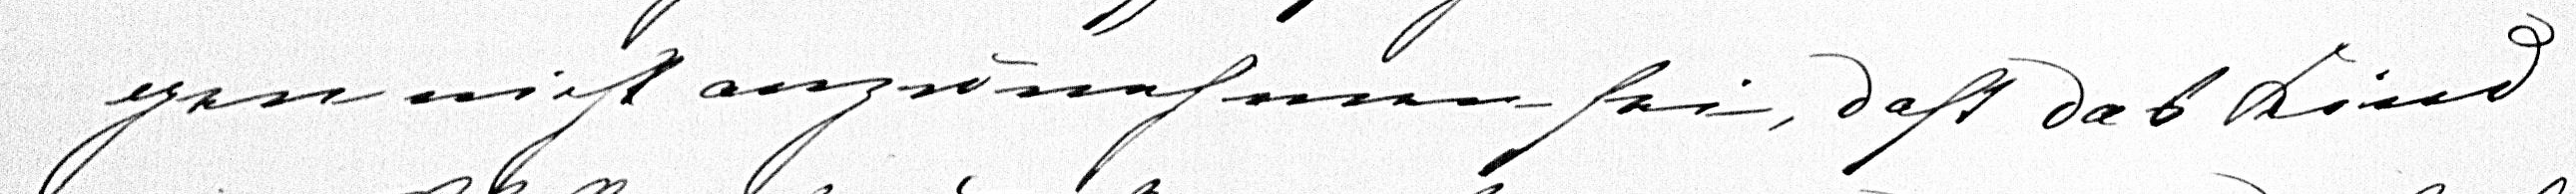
gen nicht anzunehmen sei, daß das Kind
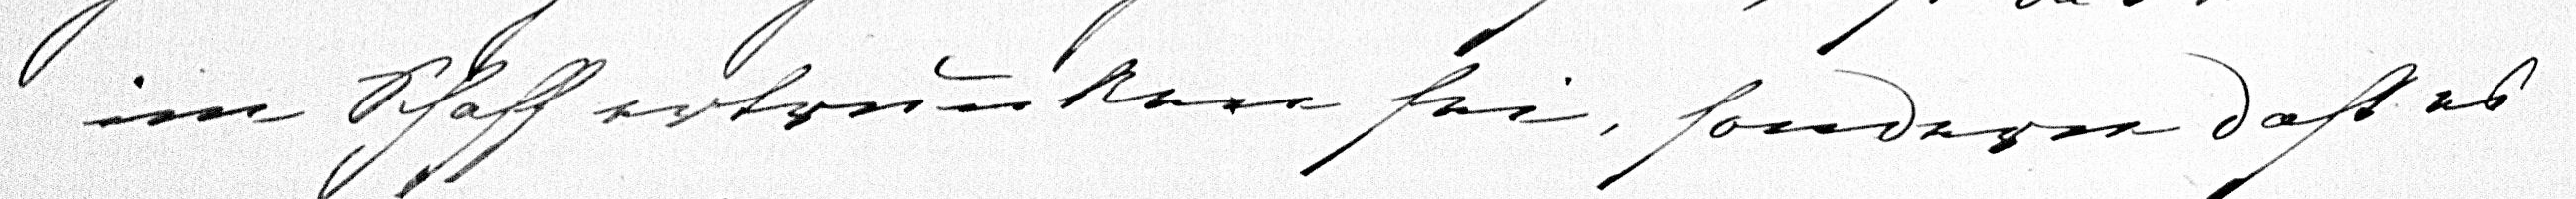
im Schaffertrunken sei, sondern daß es
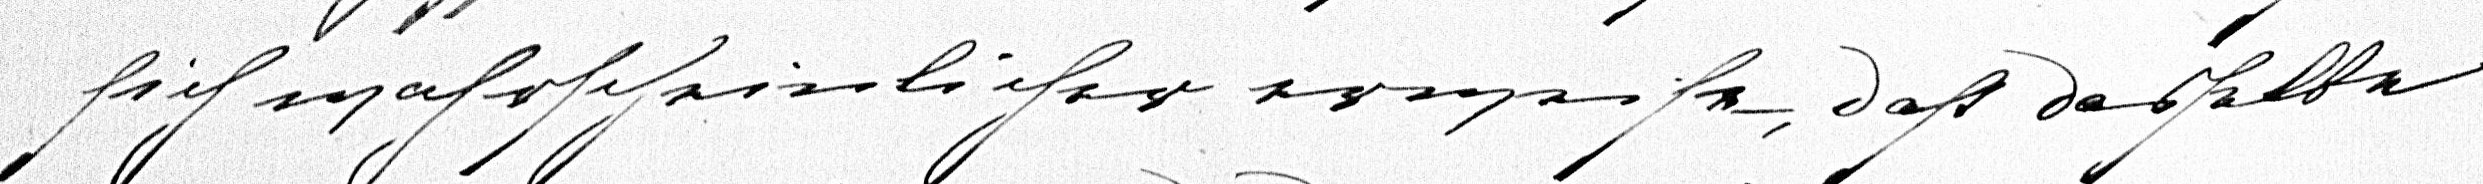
sich wahrscheinlicher erweise, daß dasselbe
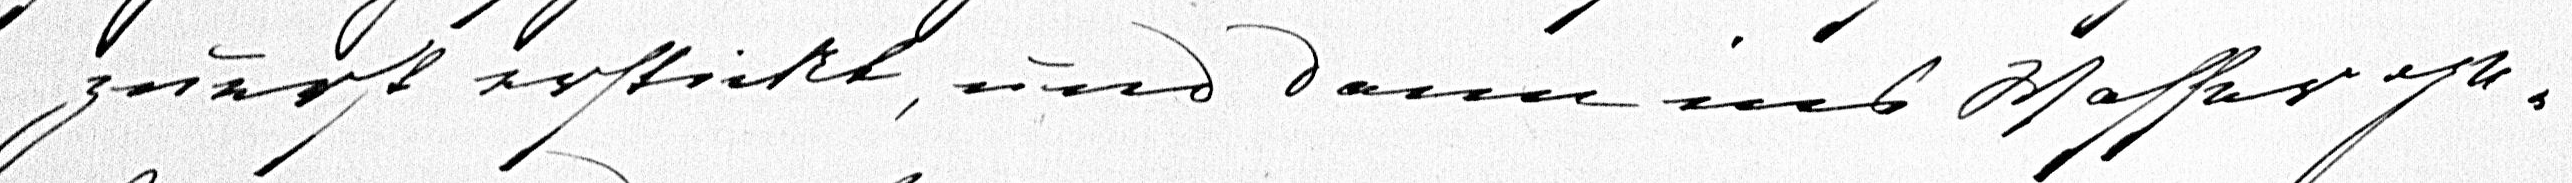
zuerst erstickt, und dann ins Wasser ge¬
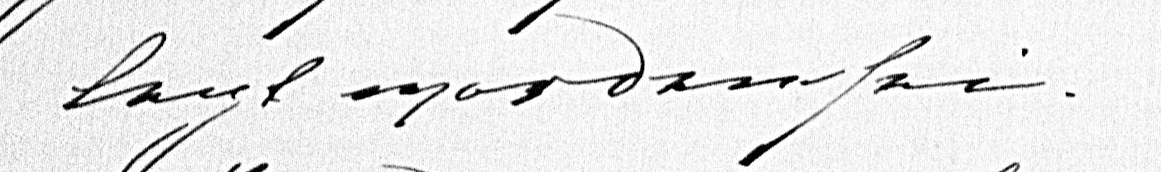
legt worden sei.
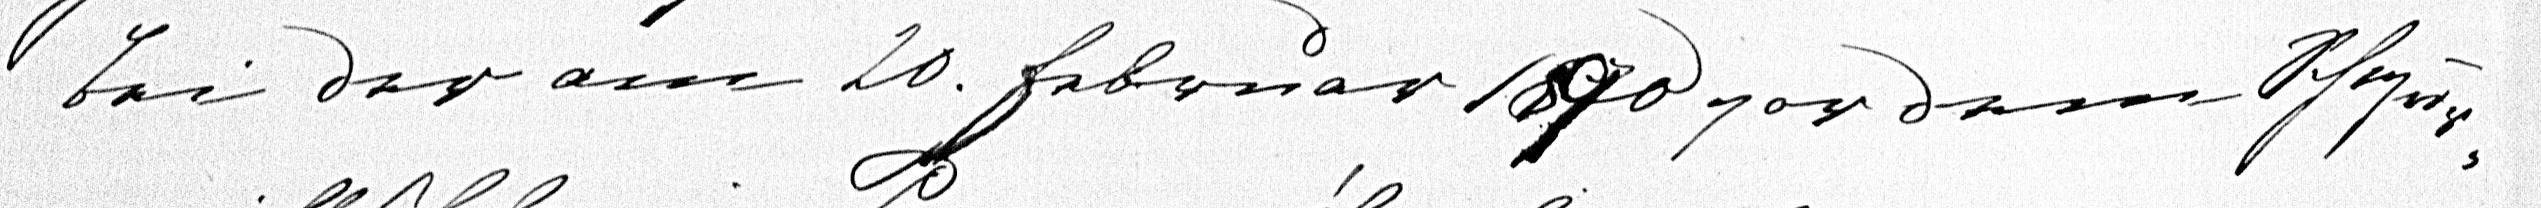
Bei der am 20. Februar 1890 vor dem Schwur¬
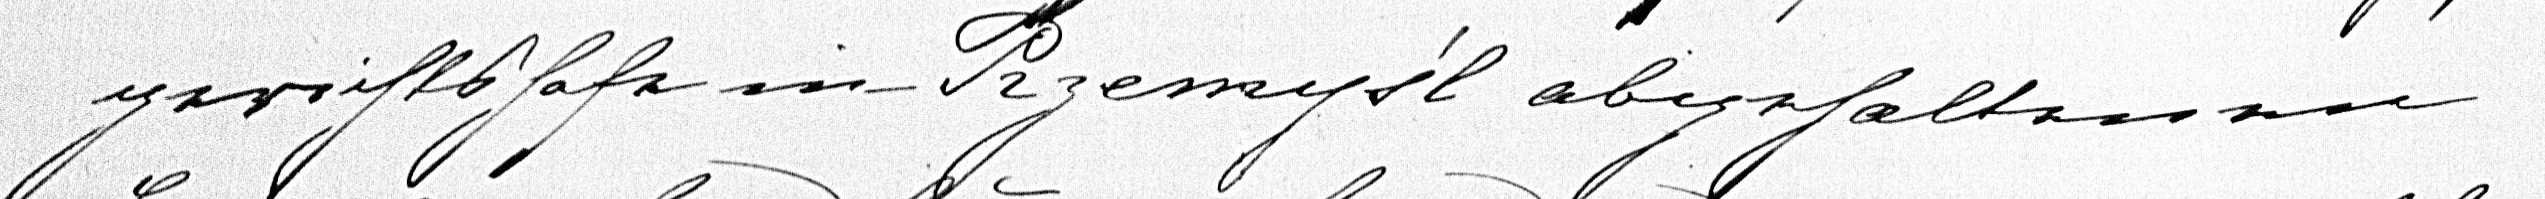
gerichtshofe in Przemyśl abgehaltenen
